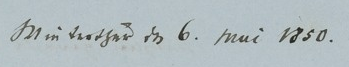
Winterthur den 6. Mai 1850.
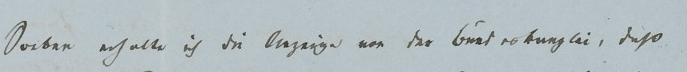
Soeben erhalte ich die Anzeige von der Bundeskanzlei, daß
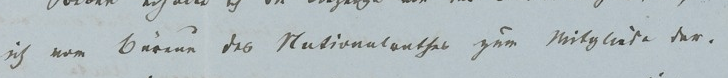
ich vom Bureau des Nationalrathes zum Mitgliede der-
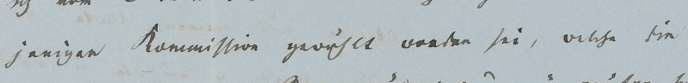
jenigen Kommission gewählt worden sei, welche die
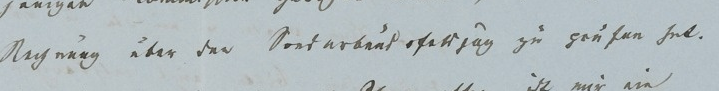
Rechnung über den Sonderbundsfeldzug zu prüfen hat.
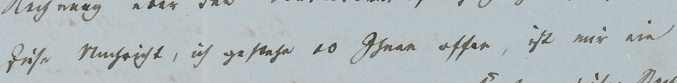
Diese Nachricht, ich gestehe es Ihnen offen, ist mir ein
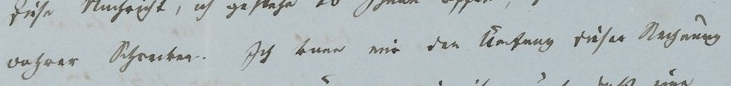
wahrer Schrecken. Ich kann mir den Umfang dieser Rechnung
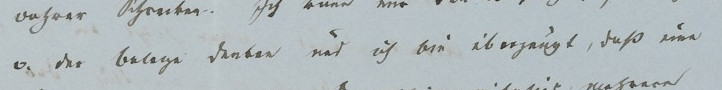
&. der Belege denken und ich bin überzeugt, daß eine
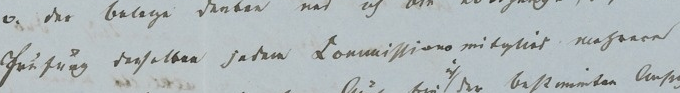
Prüfung derselben jedem Commissionsmitglied mehrere
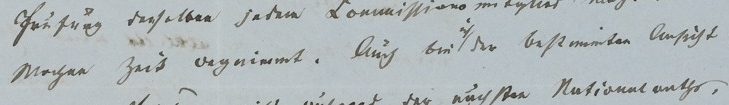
Wochen Zeit wegnimmt. Auch bin ich der bestimmten Ansicht,
